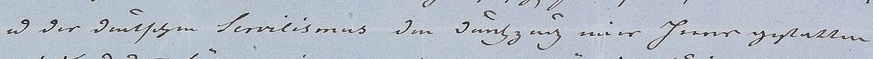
u des deutschen Servilismus den Durchzug eines Heeres gestatten
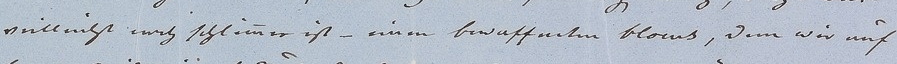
vielleicht noch schlimmer ist – einen bewaffneten blocus, dem wir auf
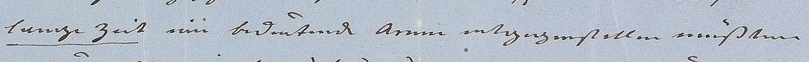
lange Zeit eine bedeutende Armee entgegenstellen müßten.
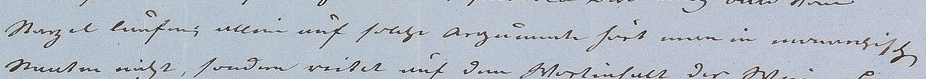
Stapel laufen; allein auf solche Argumente hört man in monarchischen
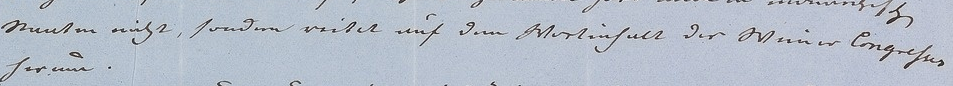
Staaten nicht, sondern reitet auf dem Wortinhalt des Wiener Congresses
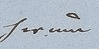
herum.
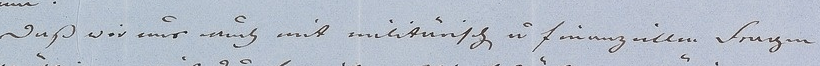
Daß wir uns auch mit militärischen u finanziellen Fragen
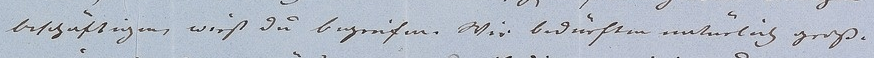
beschäftigen, wirst du begreifen. Wir bedürften natürlich groß-
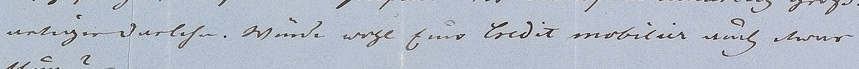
artiger Darlehn. Würde wohl Euer Credit mobilier auch etwas
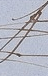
v.
